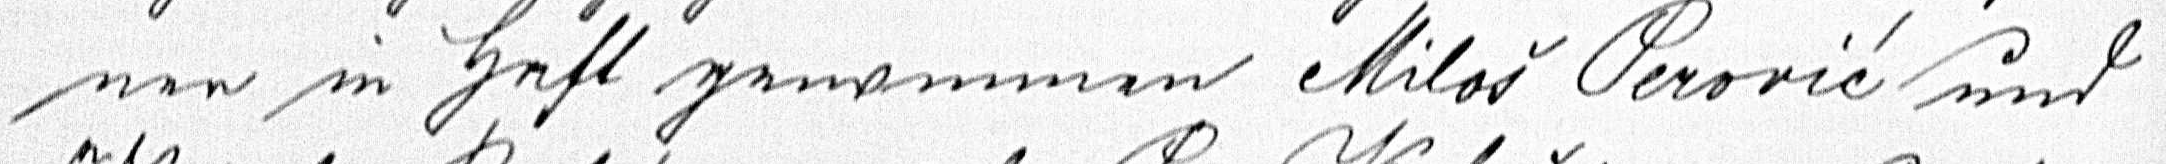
ner in Haft genommen Miloš Perović und
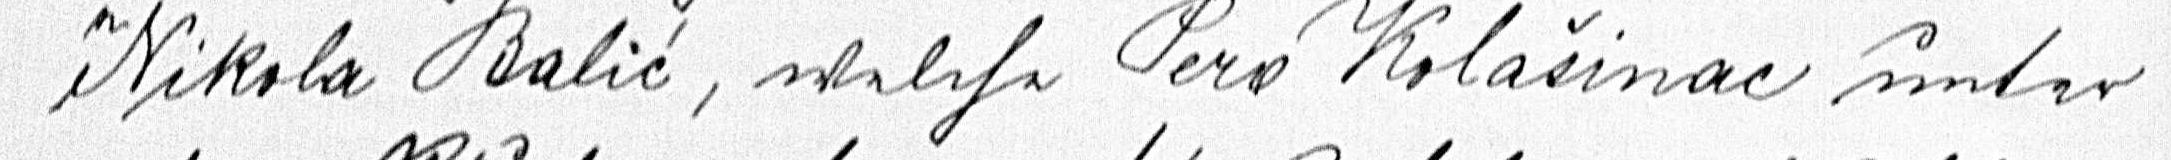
Nikola Balić, welche Pero Kolašinac unter
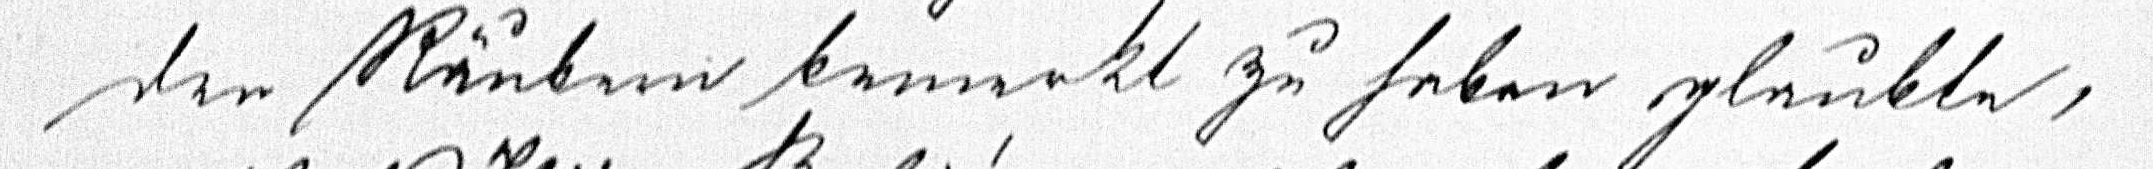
den Räubern bemerkt zu haben glaubte,
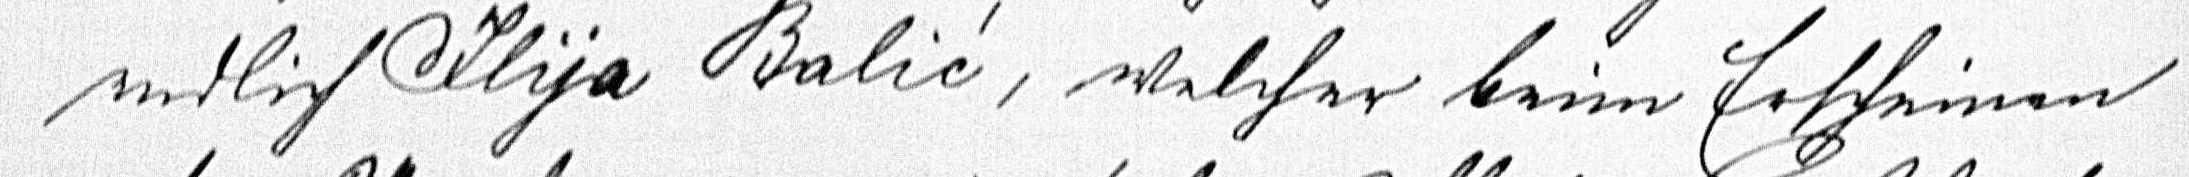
endlich Ilija Balić, welcher beim Erscheinen
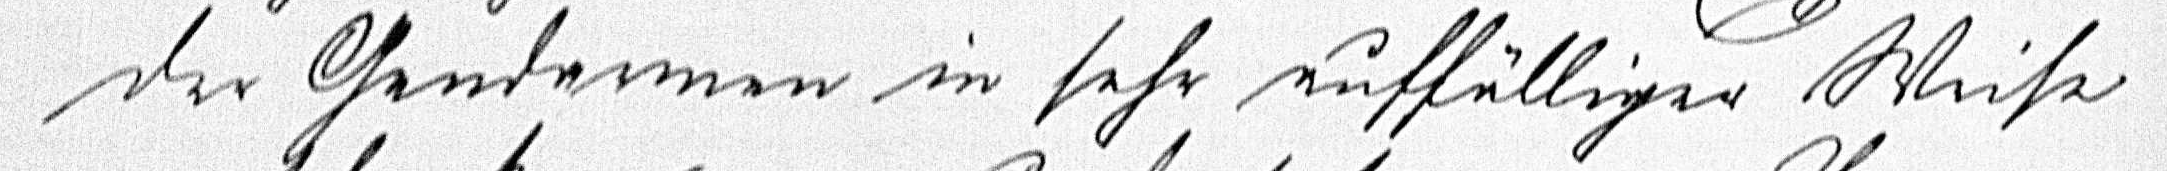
der Gendarmen in sehr auffälliger Weise
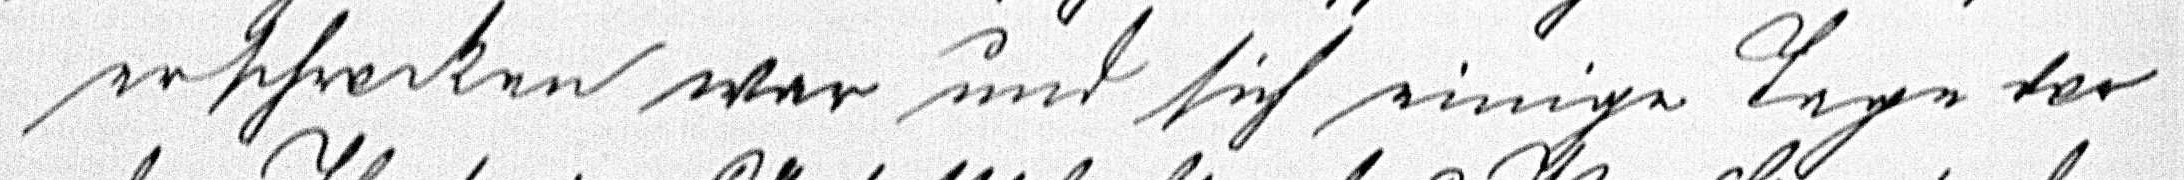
erschrecken war und sich einige Tage vor
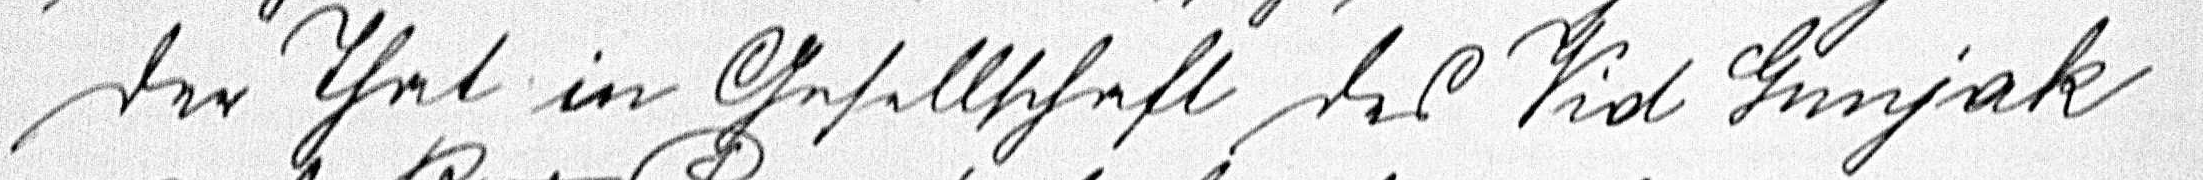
der That in Gesellschaft des Vid Gunjak
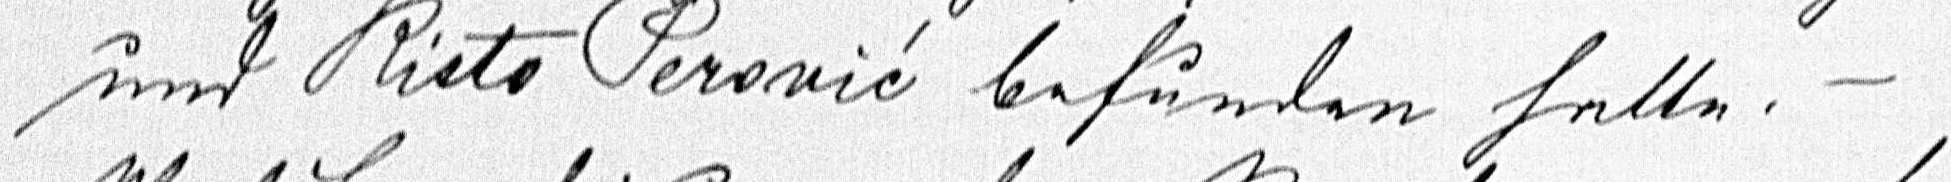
und Risto Perović befunden hatte.
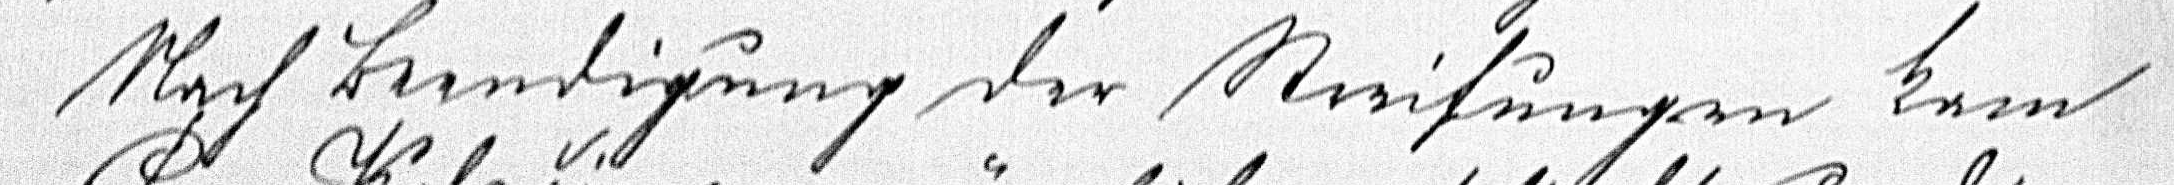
Nach Beendigung der Streifungen kam
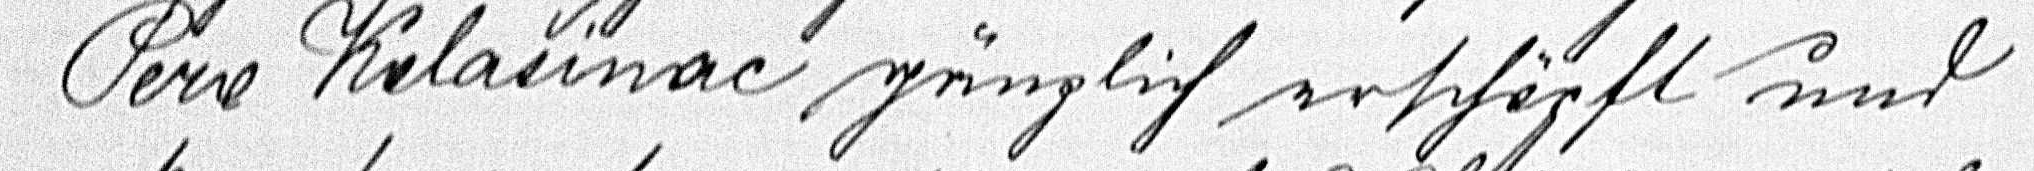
Pero Kolašinac gänzlich erschöpft und
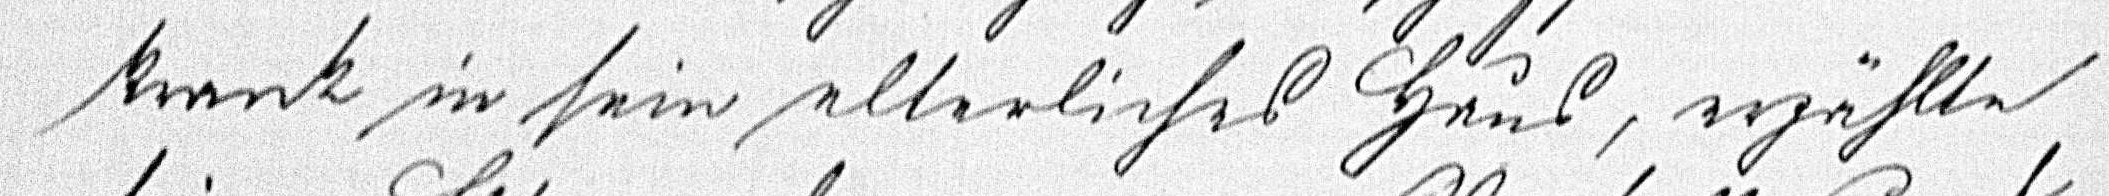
krank in sein elterliches Haus, erzählte
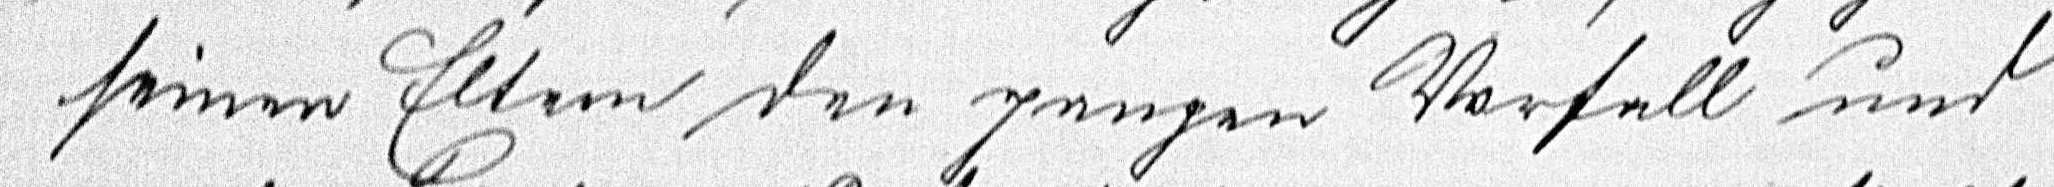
seinen Eltern den ganzen Vorfall und
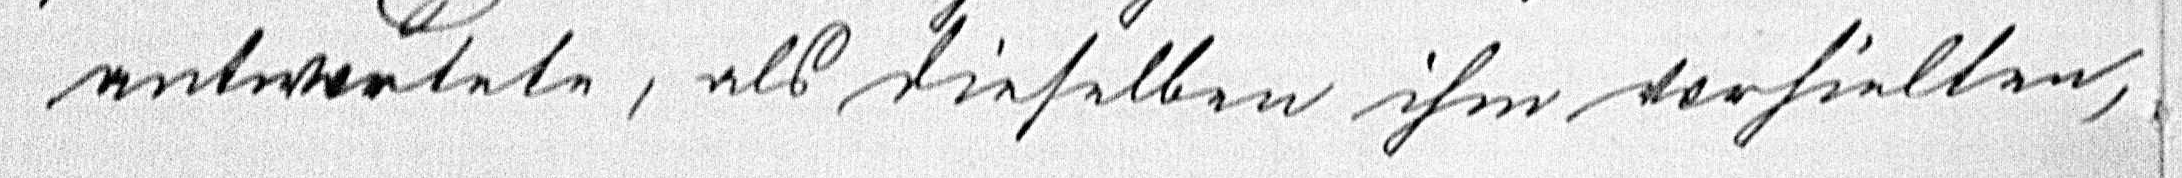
antwortete, als dieselben ihm vorhielten,
